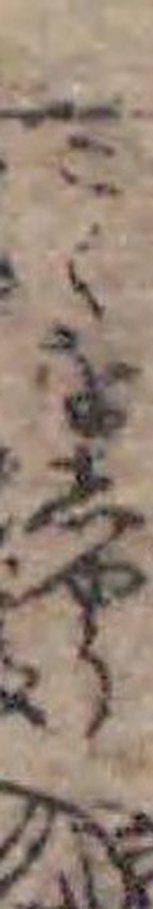こくをしやう
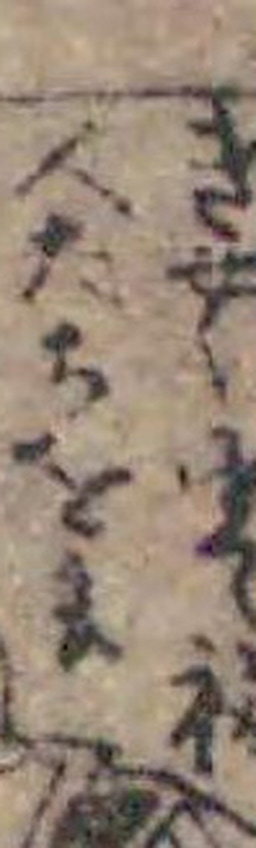人たちをま
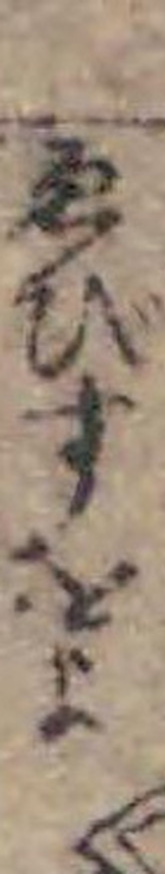ゑびすをよ
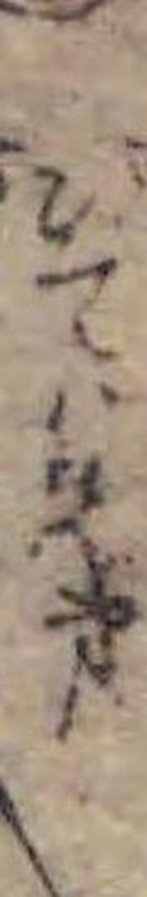びては兄弟
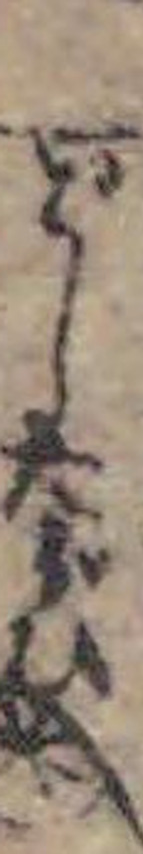どしたがひ
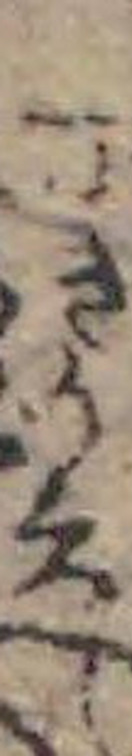きうそ
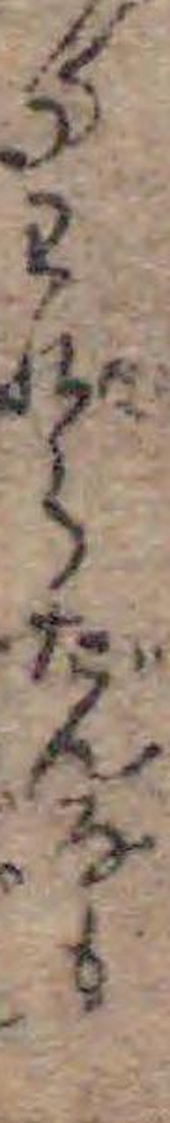われらだんなも
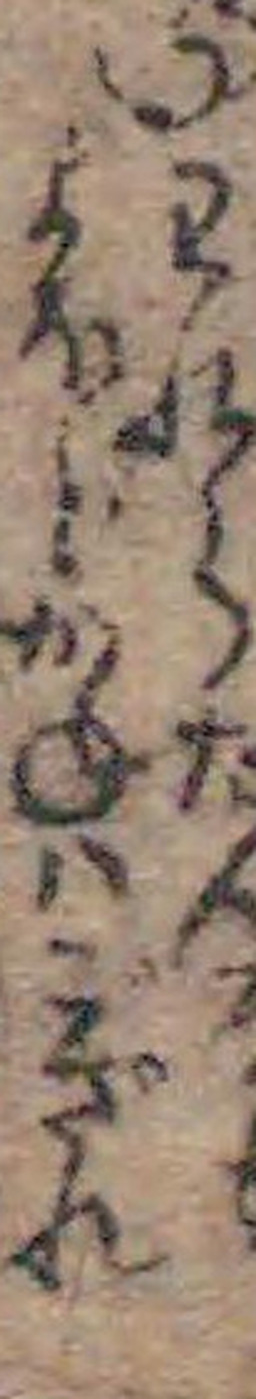よほどかねはござれ
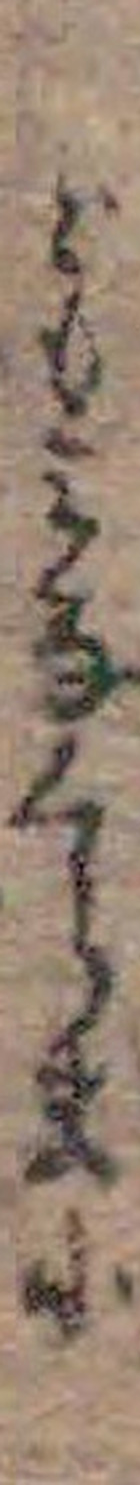どもみなくらま小
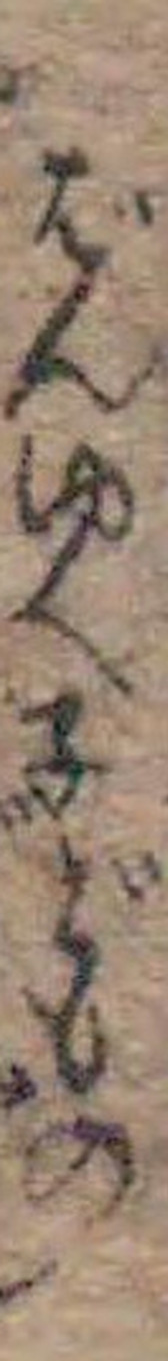ばんゆへ子どもの
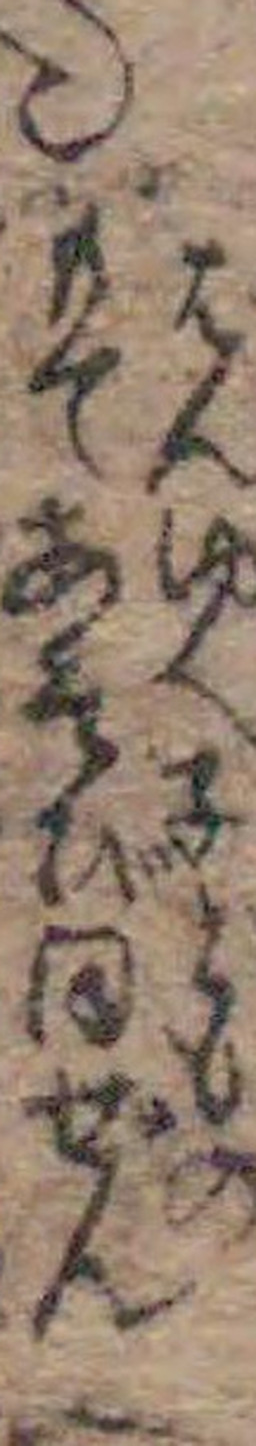もてあそび同ぜん
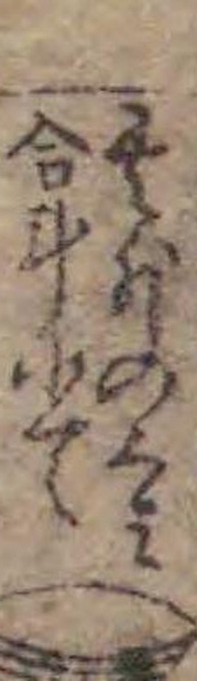合斗にて
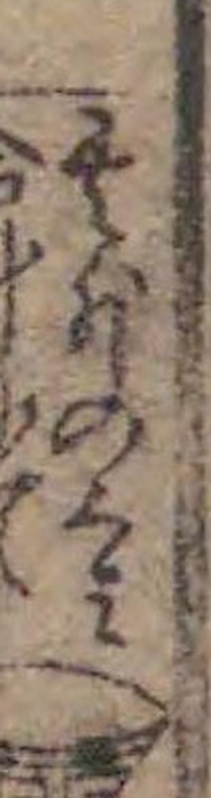其外のくみ
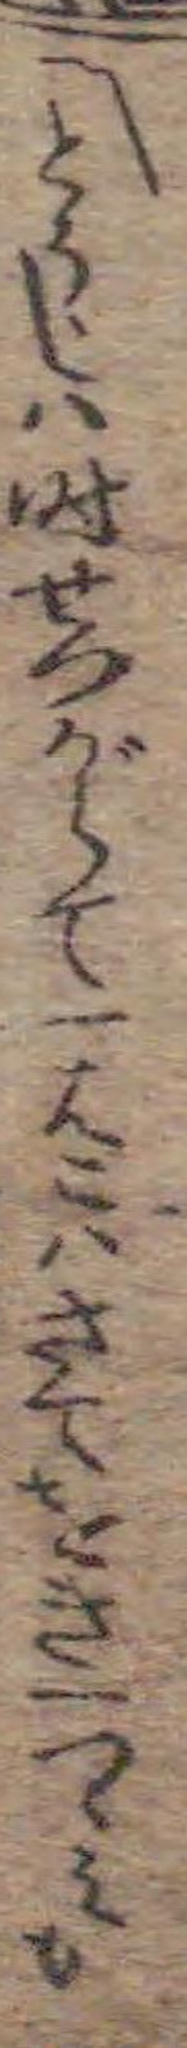〽とうじは時せつがらて一はこはさてをき一つゝみも
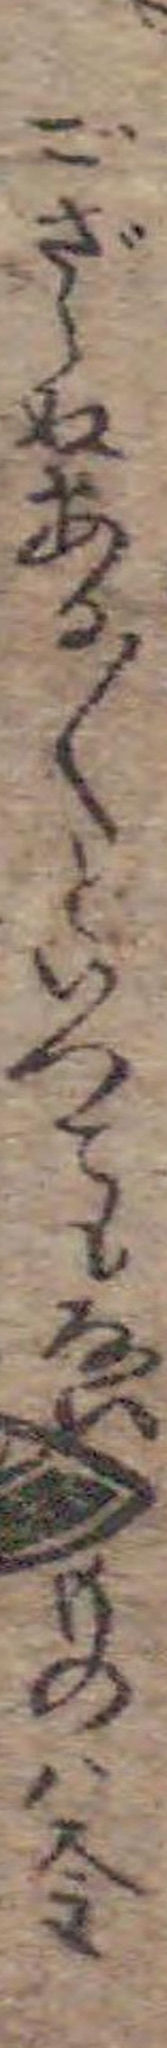ござらぬある〳〵といつてもないものは金
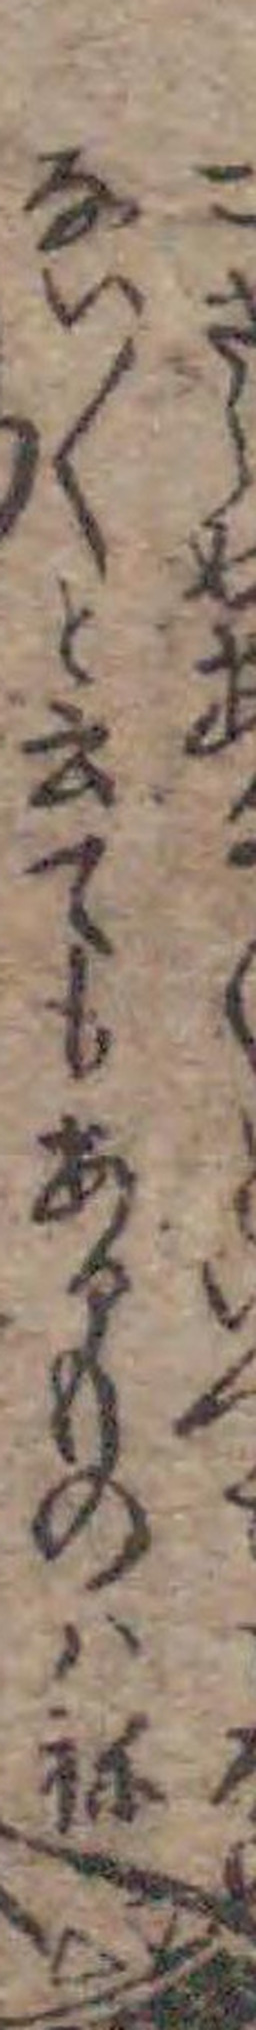ない〳〵と云てもあるものはね
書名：蛭子大黒壮年過 : 2巻
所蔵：国立国会図書館 National Diet Library, JAPAN
